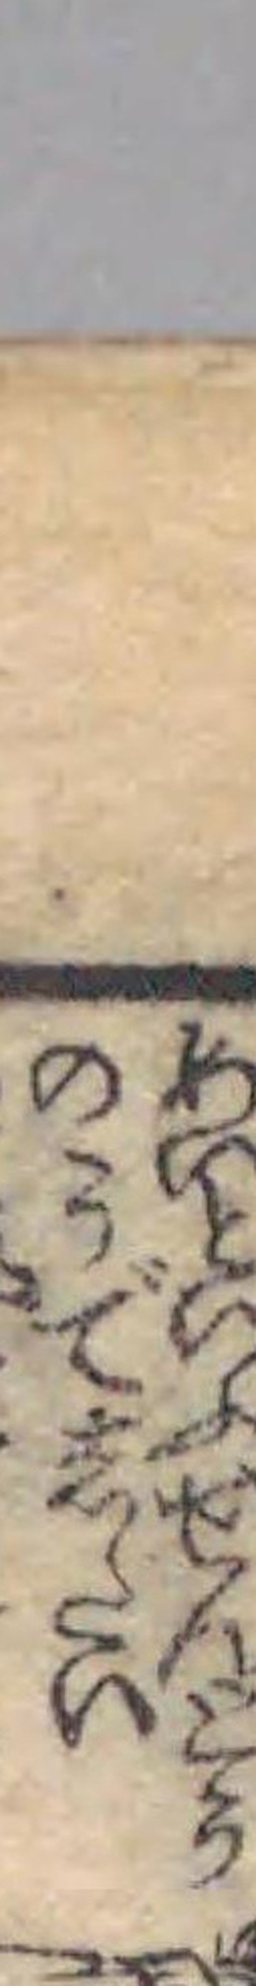のうでしたい
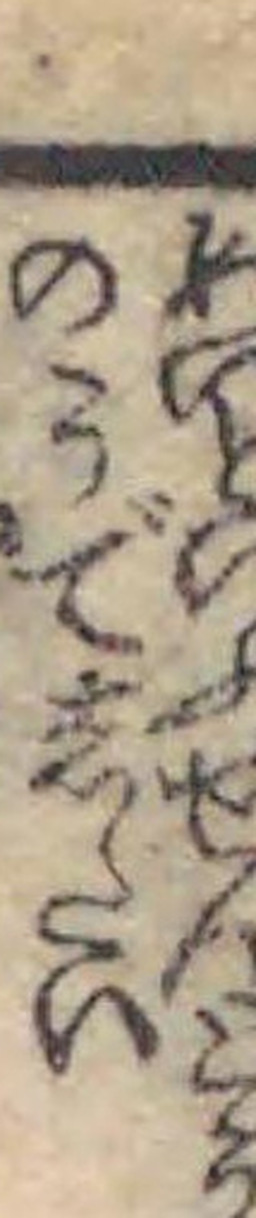のうでしたい
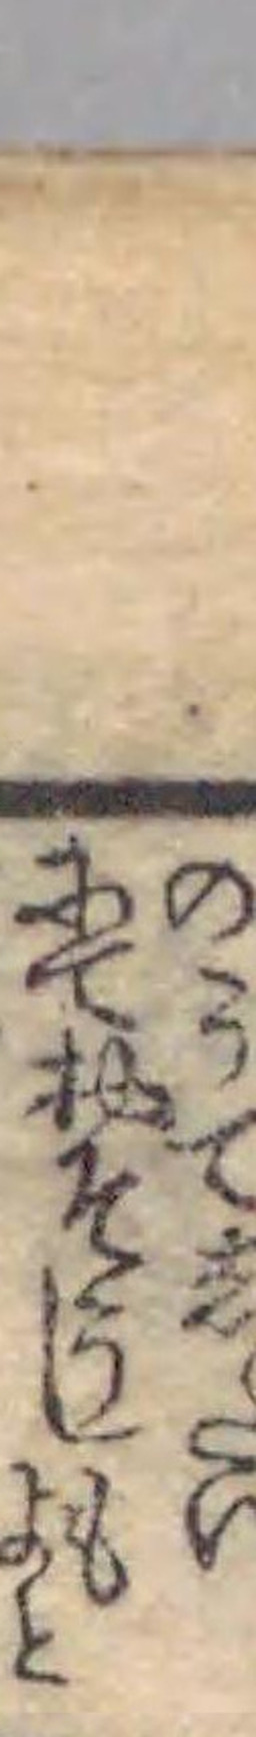にておそうしも
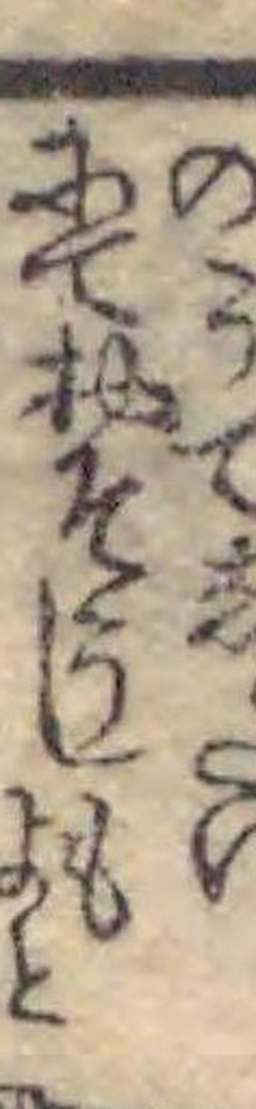にておそうしも
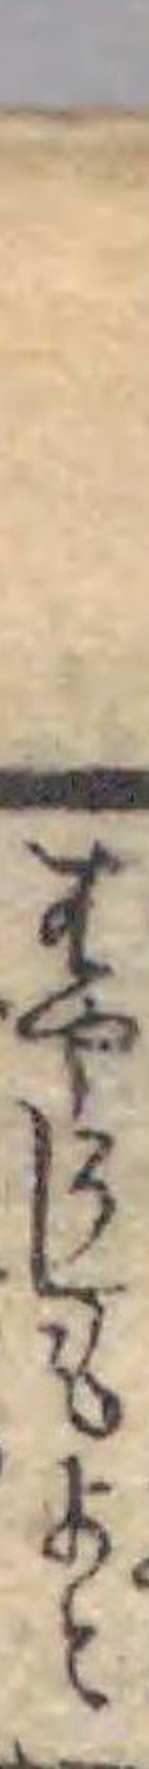はやうしもよと
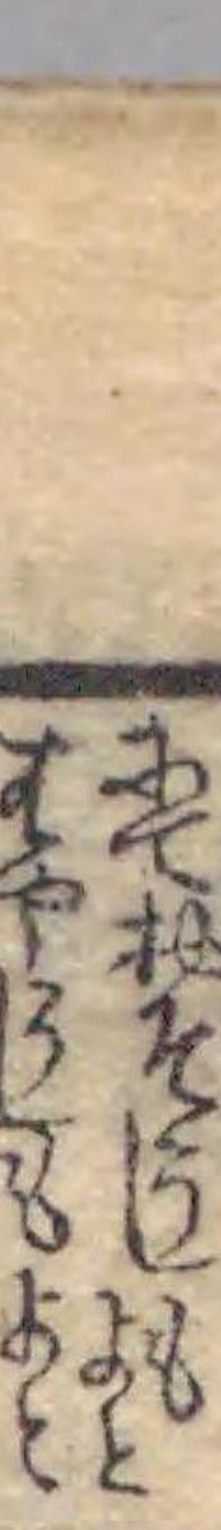はやうしもよと
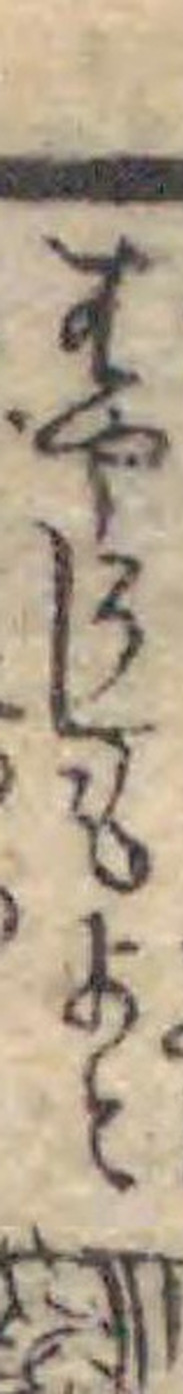はやうしもよと
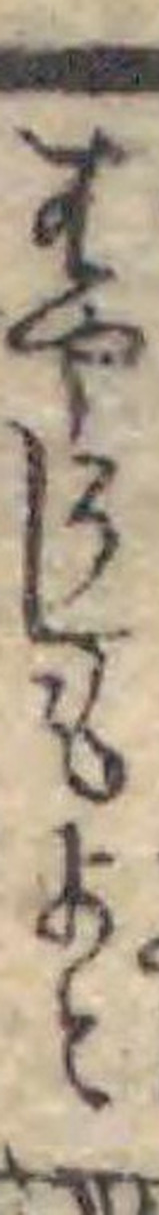はやうしもよと
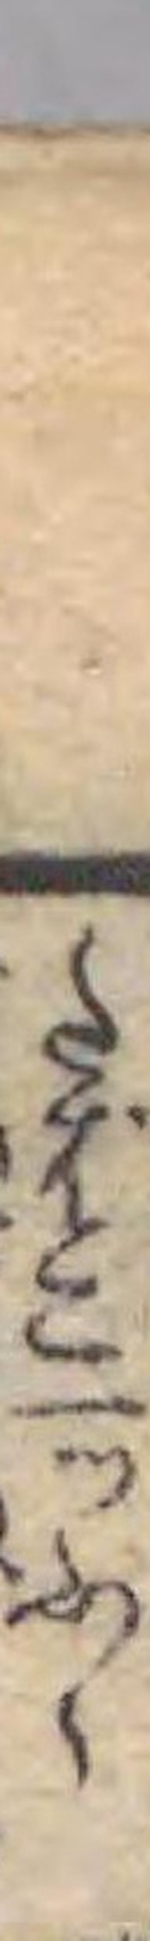たばこ一つふく
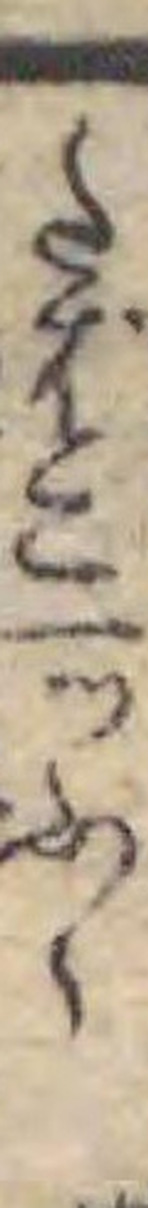たばこ一つふく
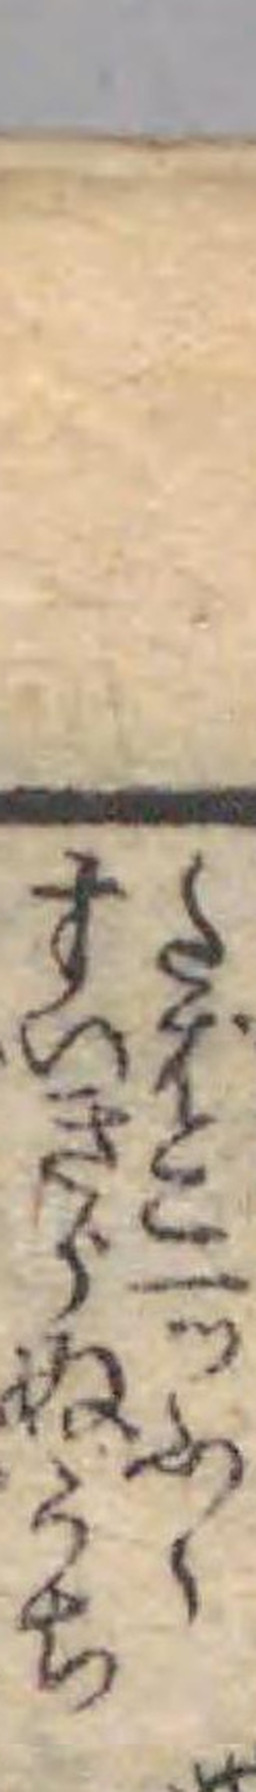すいきらぬうち
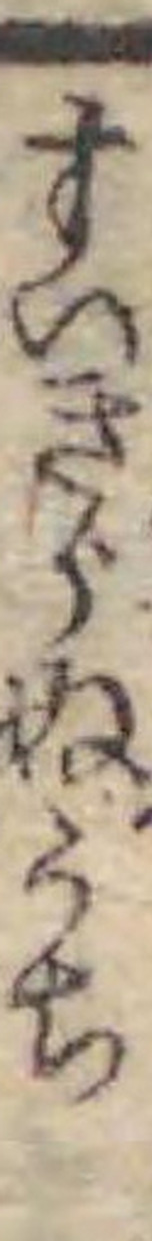すいきらぬうち
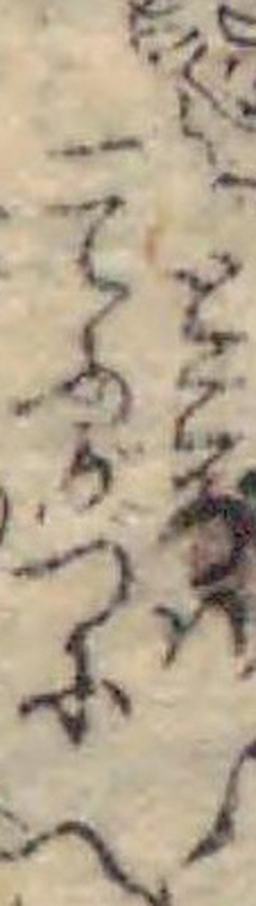一てふがづに
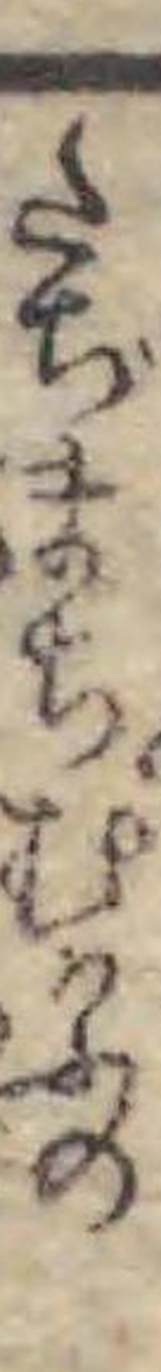たちまちむかふの
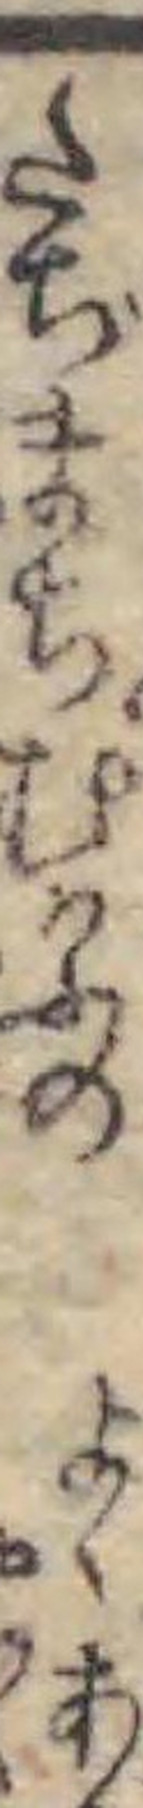たちまちむかふの
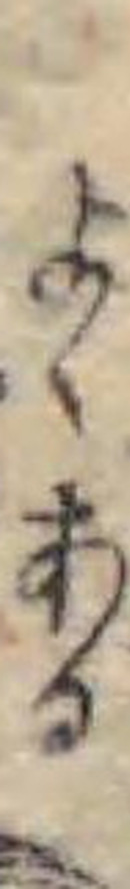よくある
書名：人心鏡写絵 : 3巻
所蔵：国立国会図書館 National Diet Library, JAPAN
